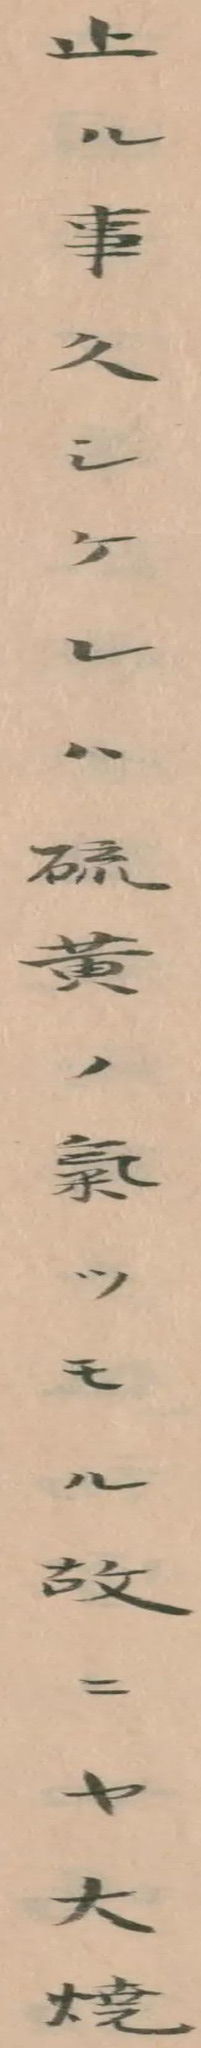止ル事久シケレハ硫黄ノ気ツモル故二ヤ大焼
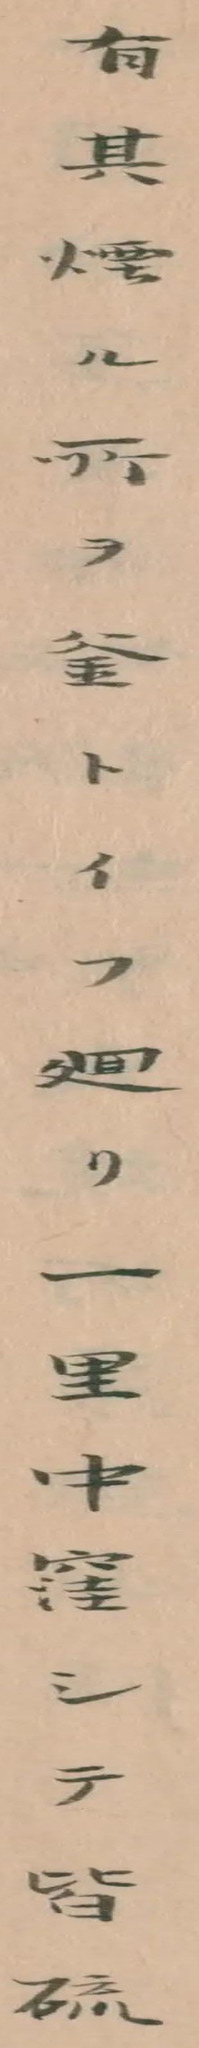有其煙ル所ヲ釜トイフ廻り一里中窪シテ皆硫
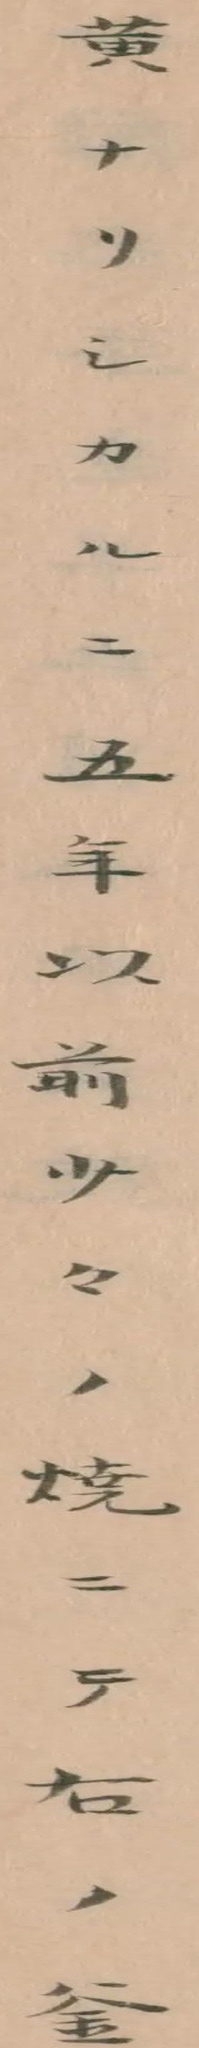黄ナリシカルニ五年以前少々ノ焼ニテ右ノ釜
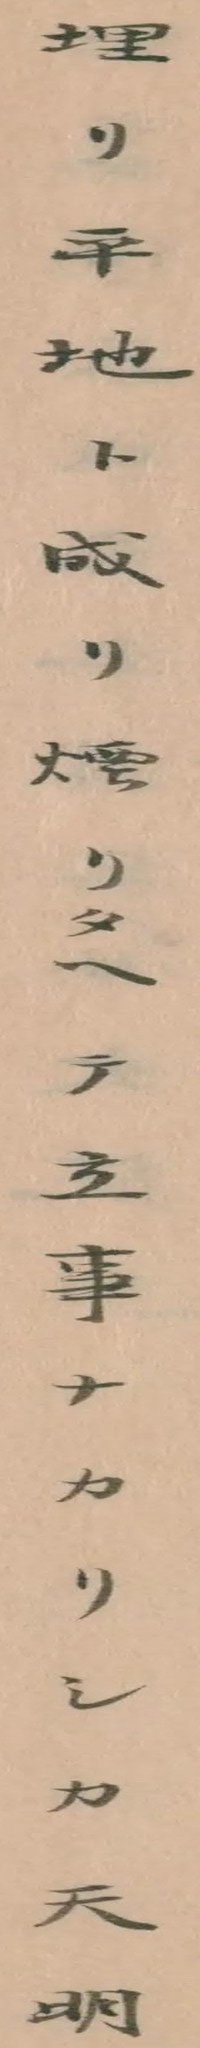埋り平地ト成り煙タへテ立事ナカリシカ天明
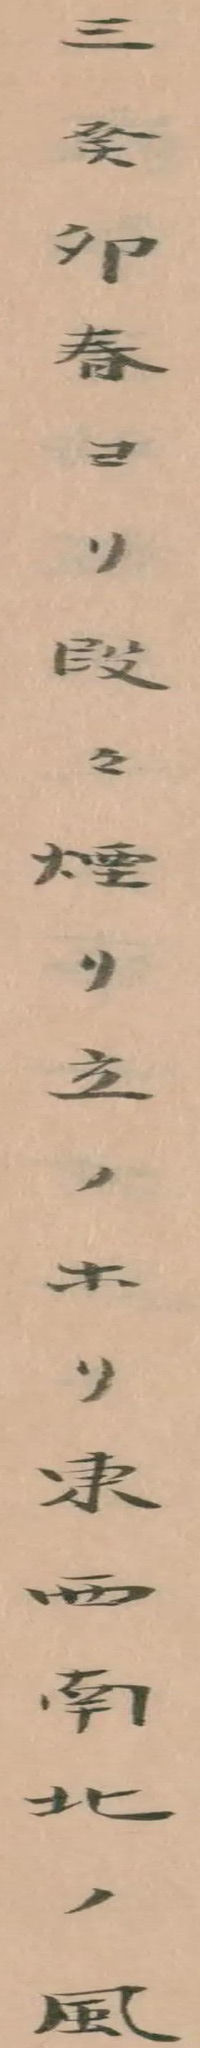三癸卯春ヨリ段々煙り立ノホリ東西南北ノ風
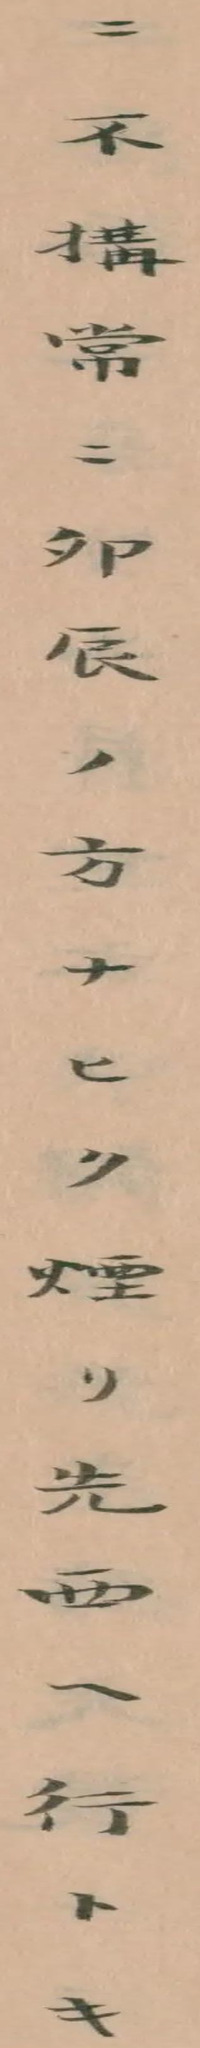二不構常二卯辰ノ方ナヒク煙り先西へ行トキ
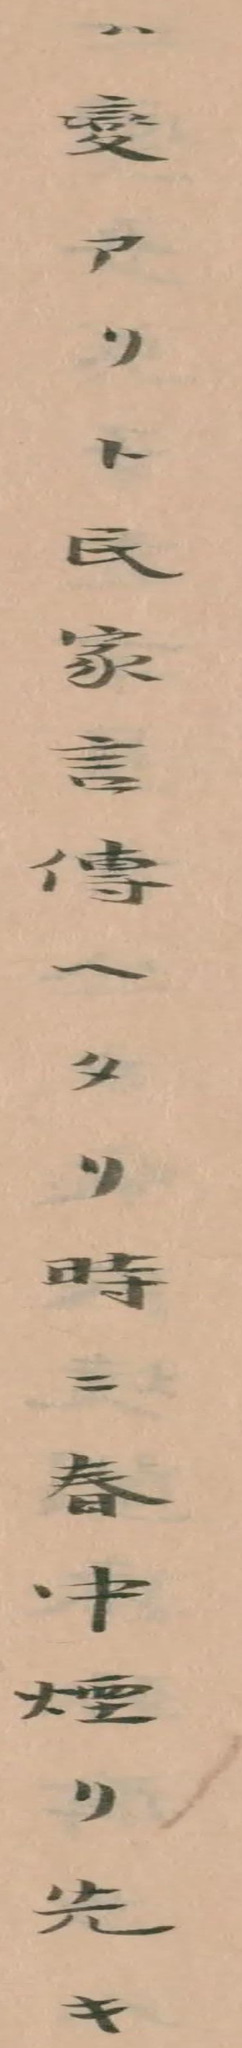ハ変アリト民家言伝へタリ時二春中煙り先キ
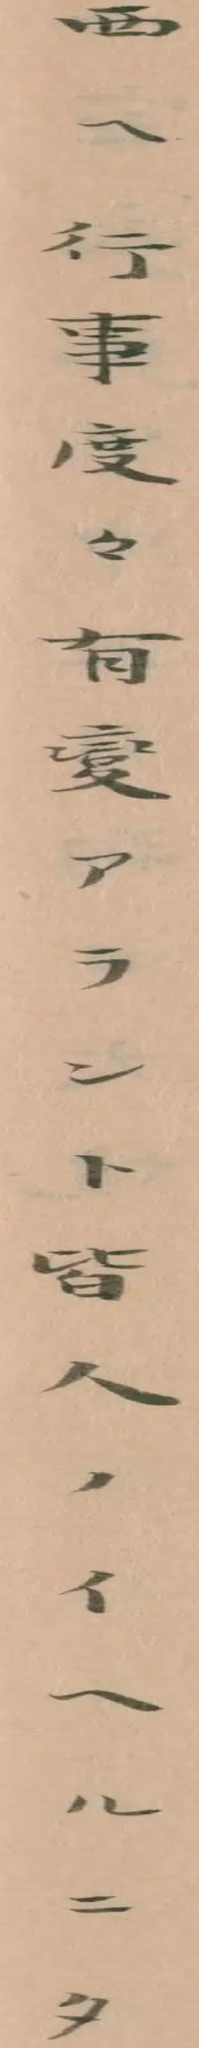西へ行事度々有変アラント皆人ノイヘル二タ
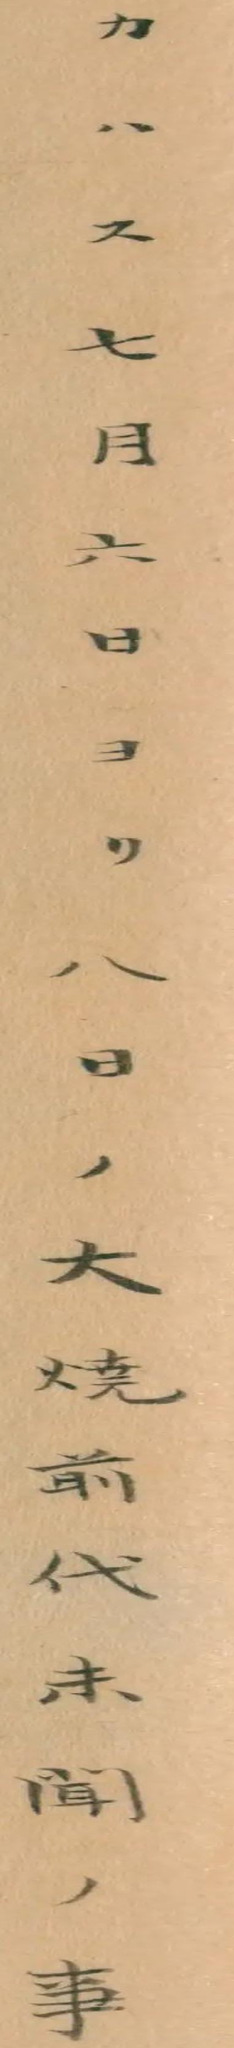カハス七月六日ヨリ八日ノ大焼前代未聞ノ事
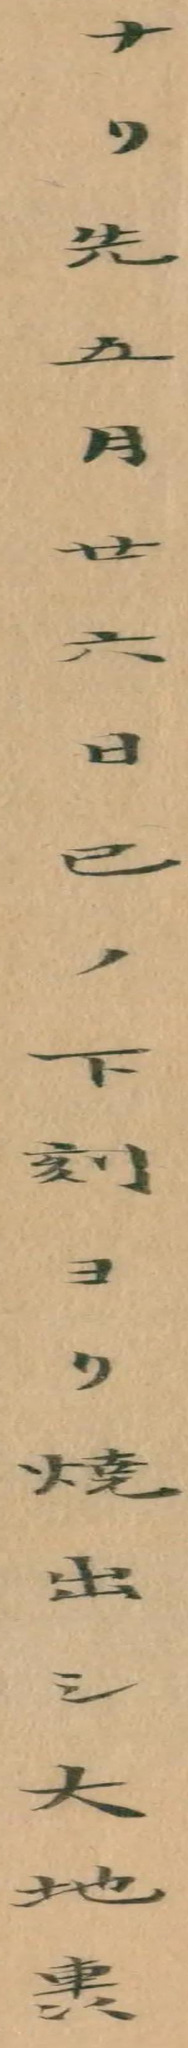ナリ先五月廿六日巳ノ下刻ヨリ焼出シ大地轟
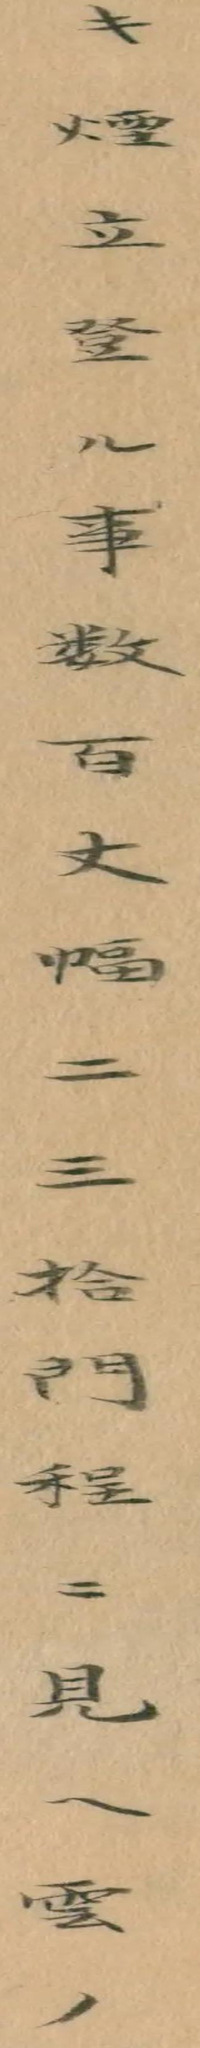キ煙立登ル事数百丈幅二三拾門程二見へ雲ノ
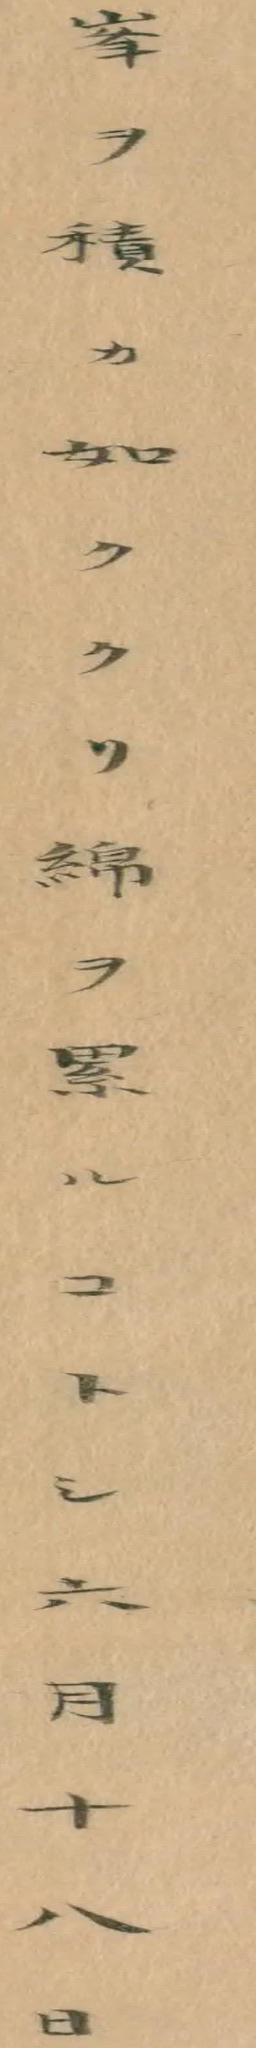峯ヲ積カ如ククリ綿ヲ累ルコトシ六月十八日
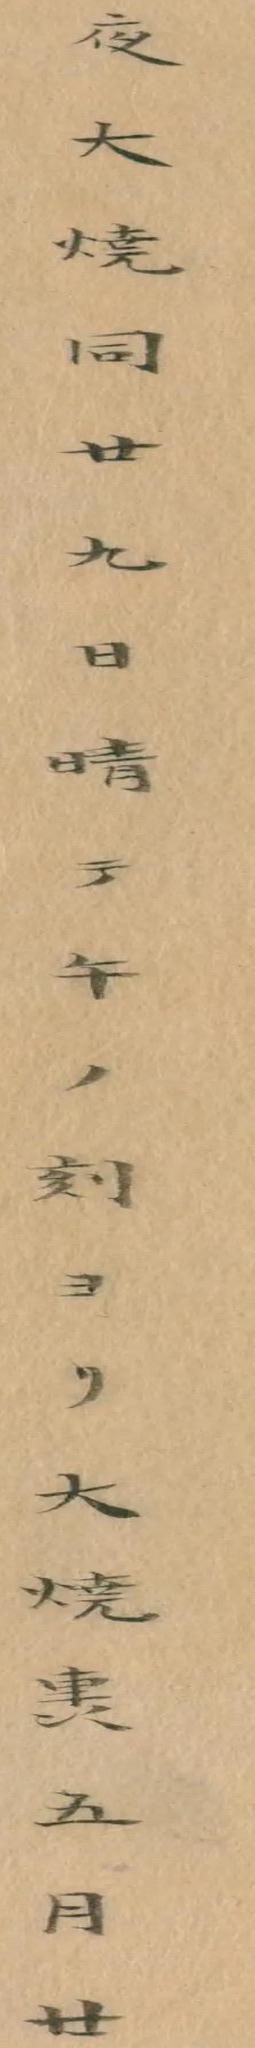夜大焼同廿九日晴テ午ノ刻ヨリ大焼轟五月廿
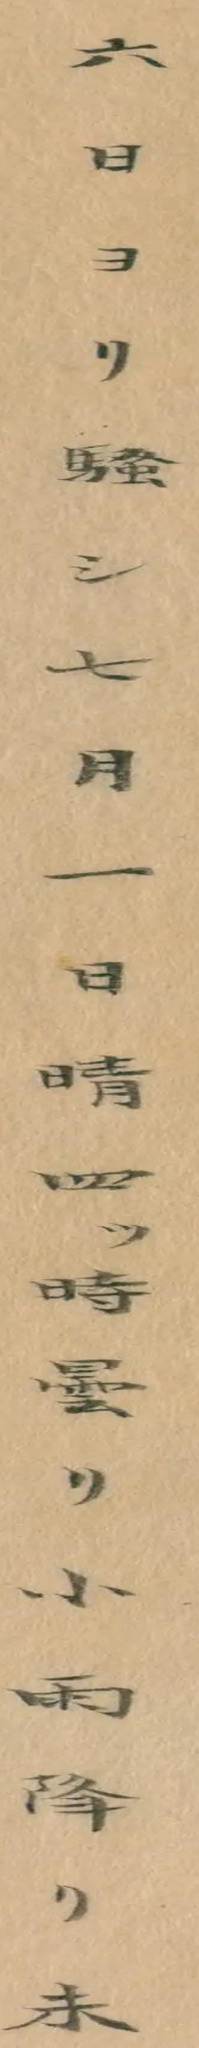六日ヨリ騒シ七月一日晴四ッ時曇り小雨降り未
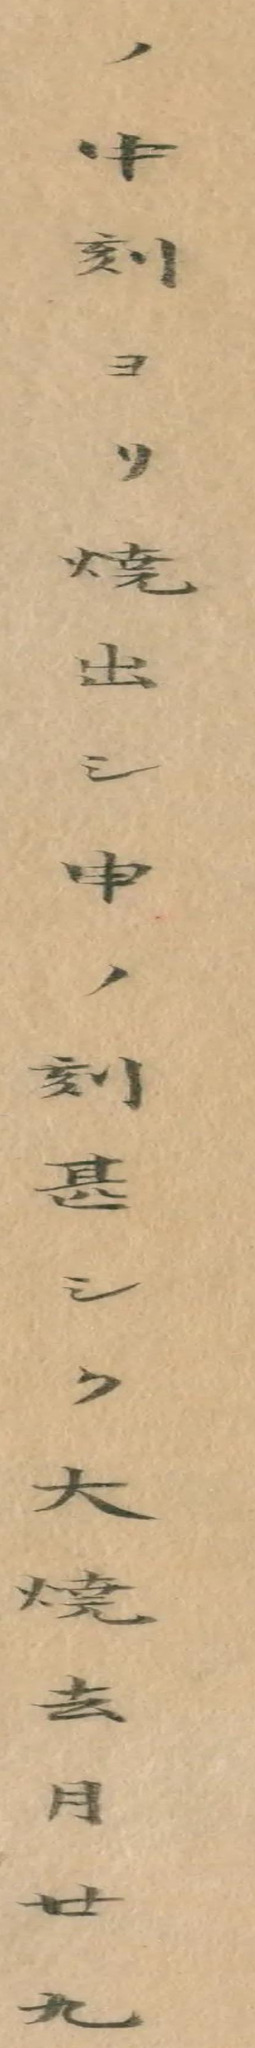ノ中刻ヨリ焼出シ申ノ刻甚シク大焼去月廿九
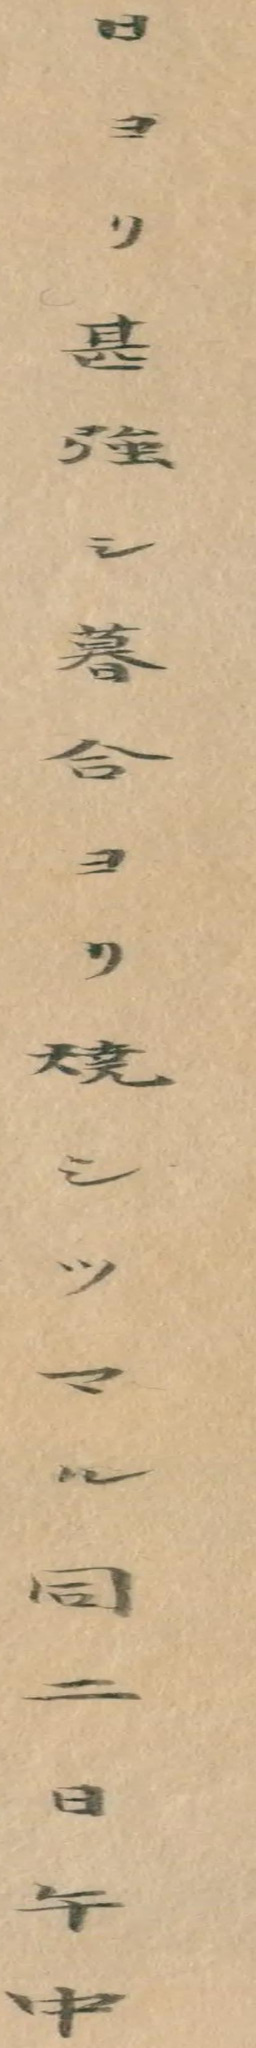日ヨリ甚強シ暮合ヨリ焼シツマル同二日午中
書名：地災撮要. 巻3(地震之部)-巻4(噴火之部)
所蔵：国立国会図書館 National Diet Library, JAPAN
